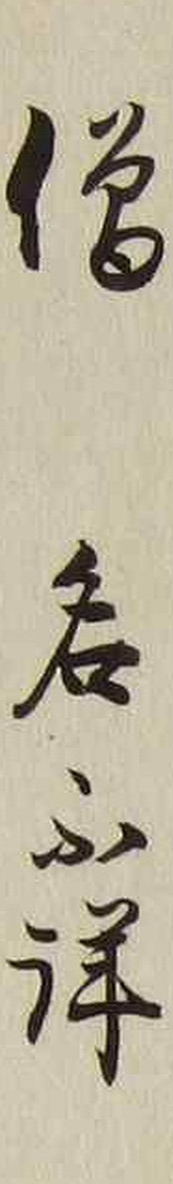僧名不詳
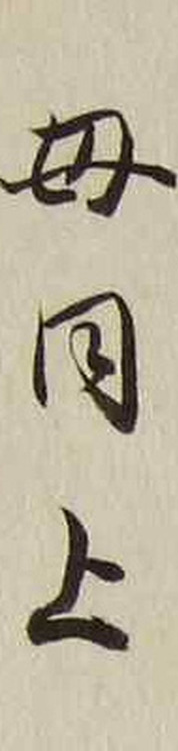母同上

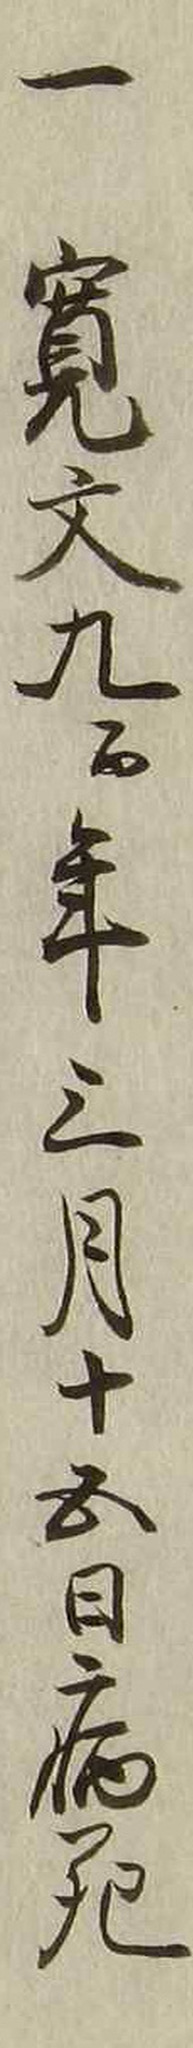一寛文九酉年三月十五日病死
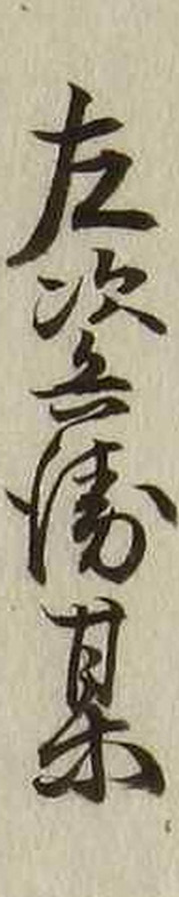左次兵衛某
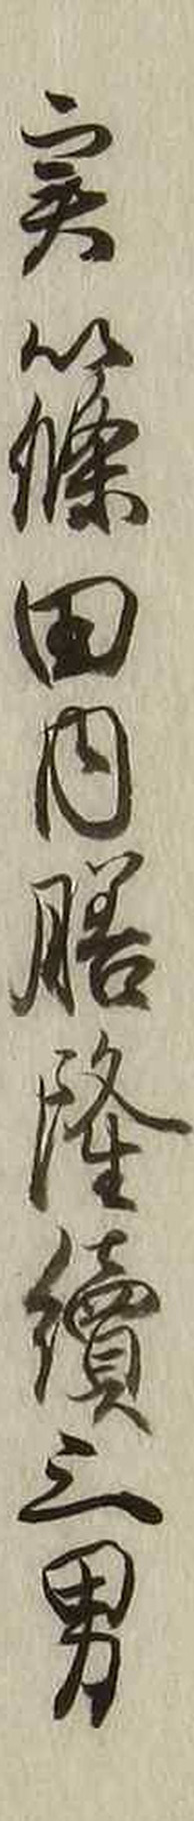実篠田内膳隆続三男
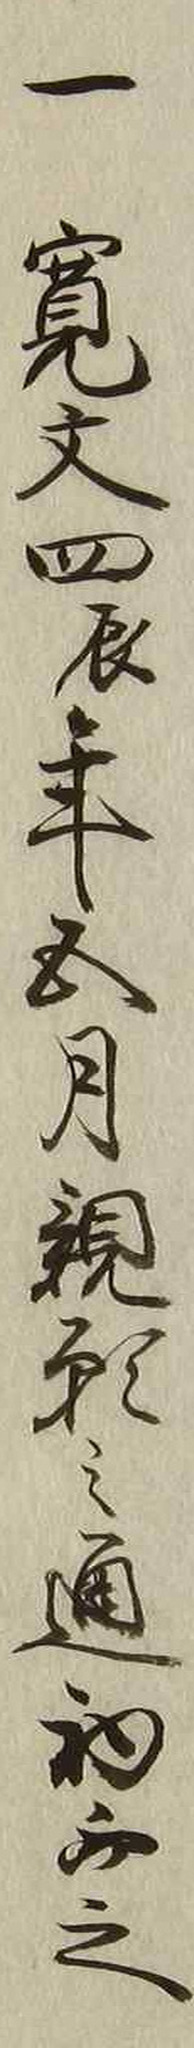一寛文四辰年五月親願之通初而之
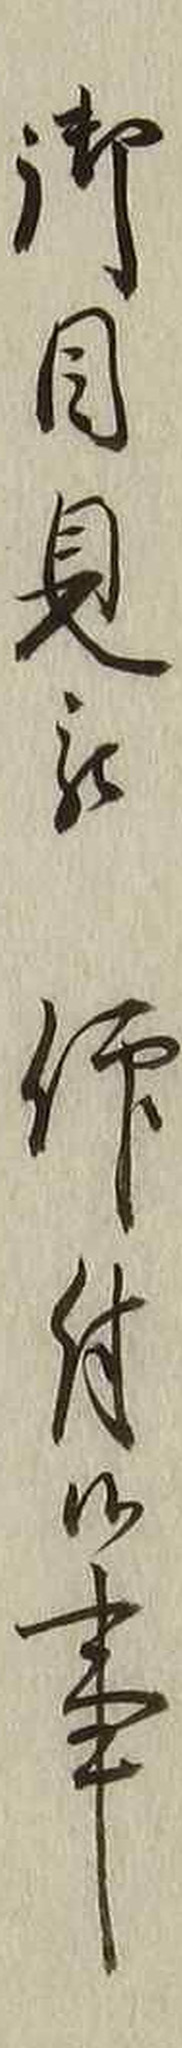御目見被仰付候事
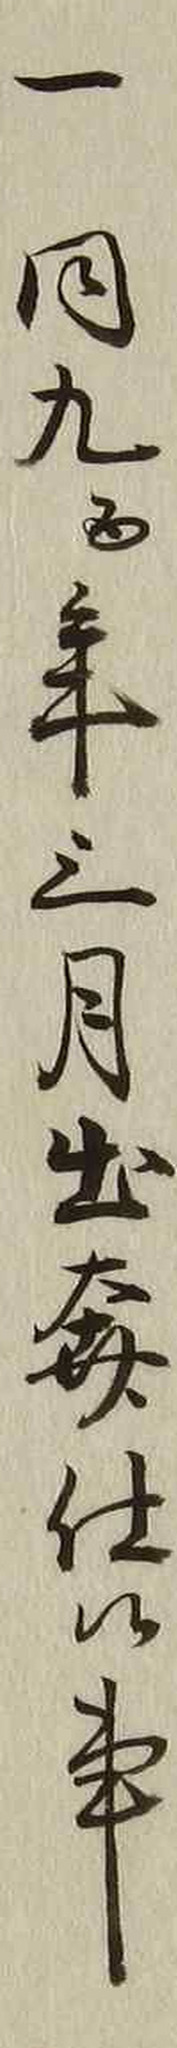一同九酉年三月出奔仕候事
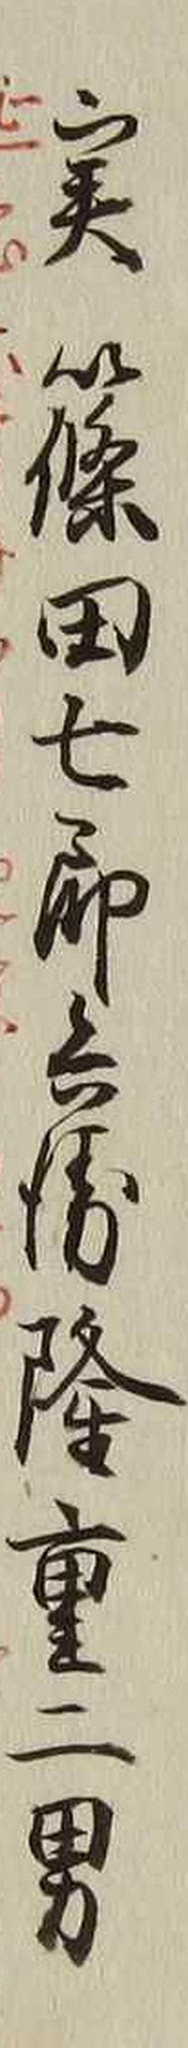実篠田七郎兵衛隆重二男
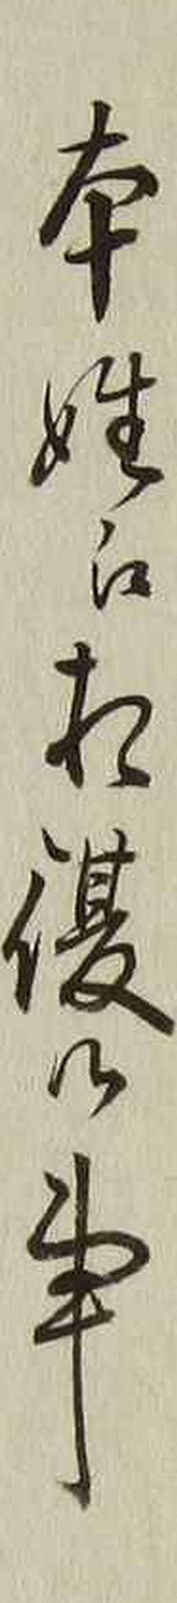本姓江相復候事
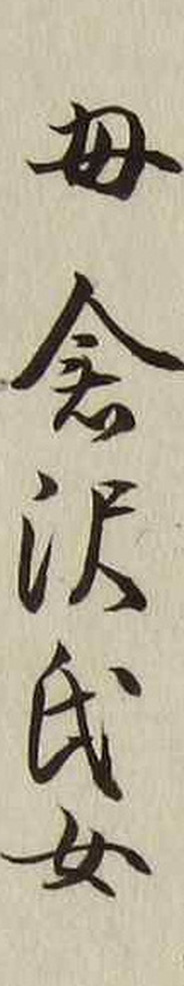母倉沢氏女
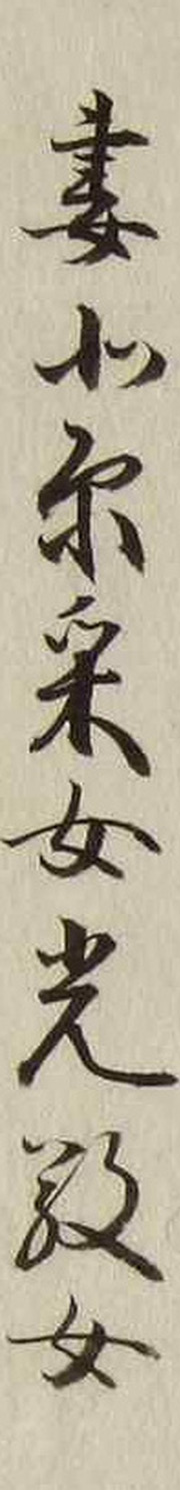妻北原采女光敬女
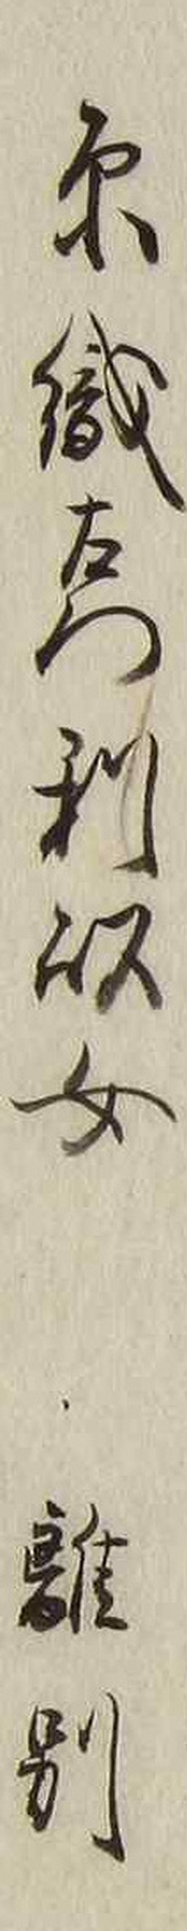原織左衛門利以女離別
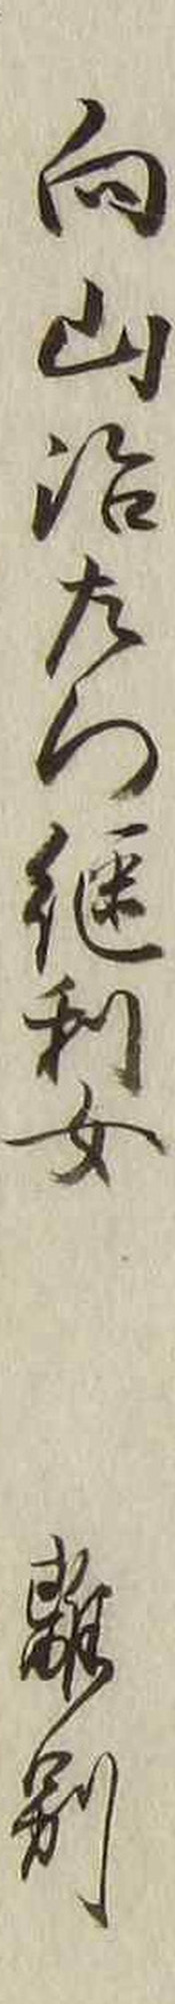向山治左衛門継利女離別
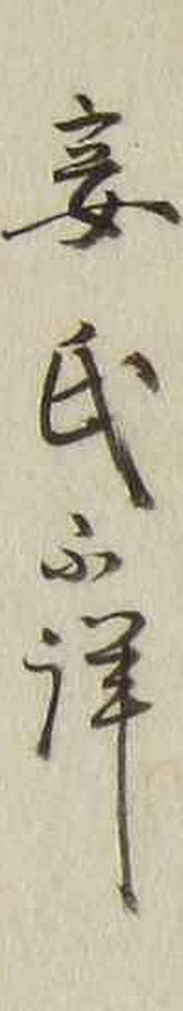妻氏不詳

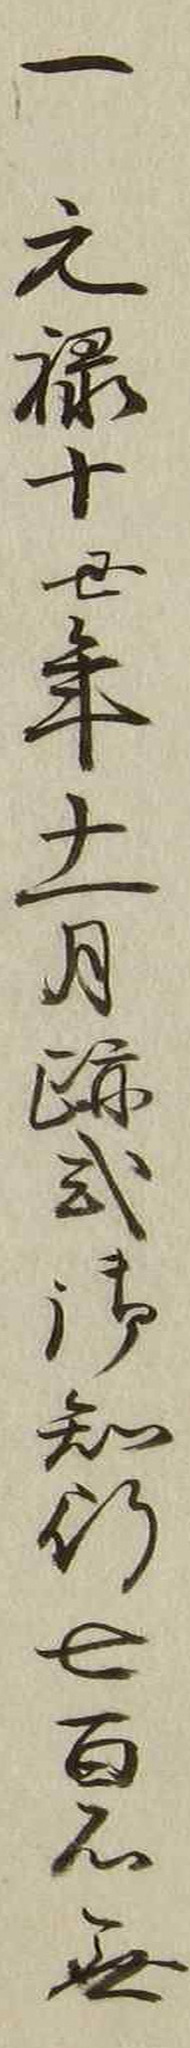一元禄十丑年十一月跡式御知行七百石無
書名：諸士系譜　巻之15　い之部15
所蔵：会津若松市立会津図書館
